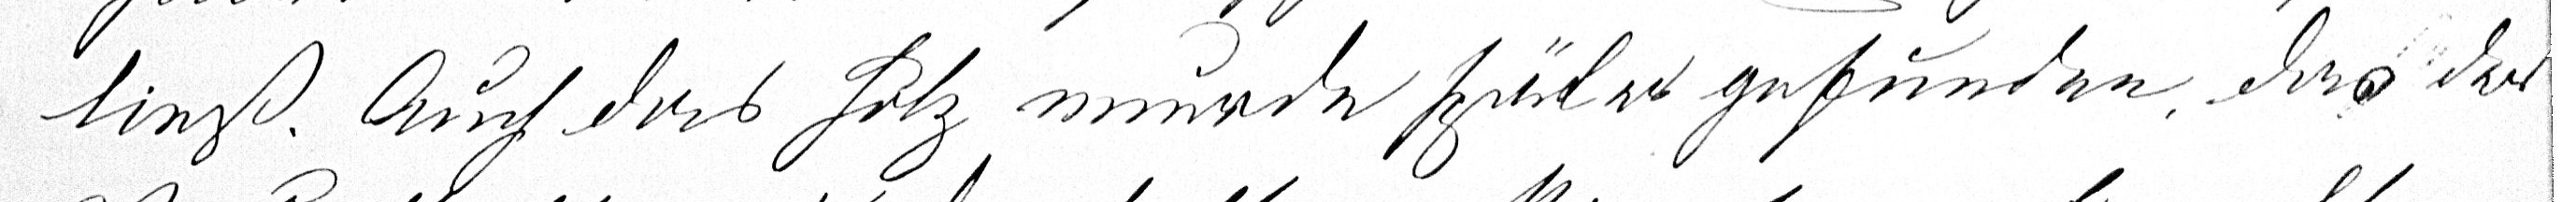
ließ. Auch das Holz wurde später gefunden, das der
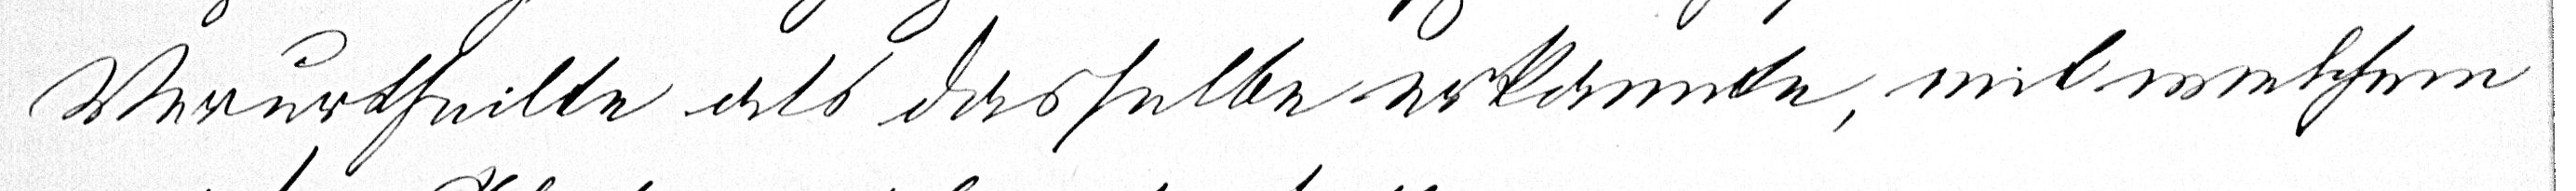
Verurtheilte als dasselbe erkannte, mit welchem
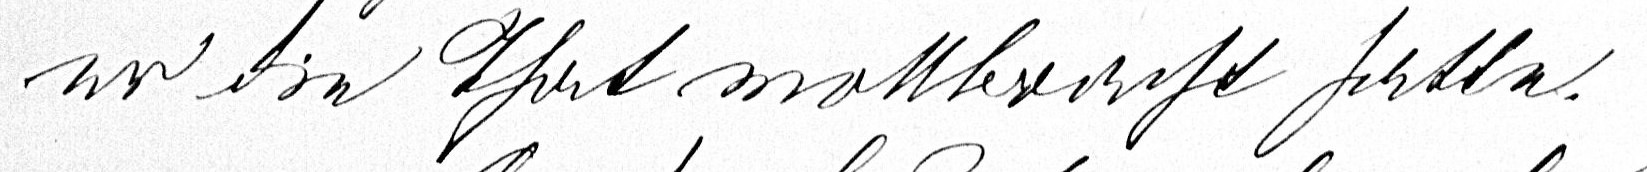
er die That vollbracht hatte.
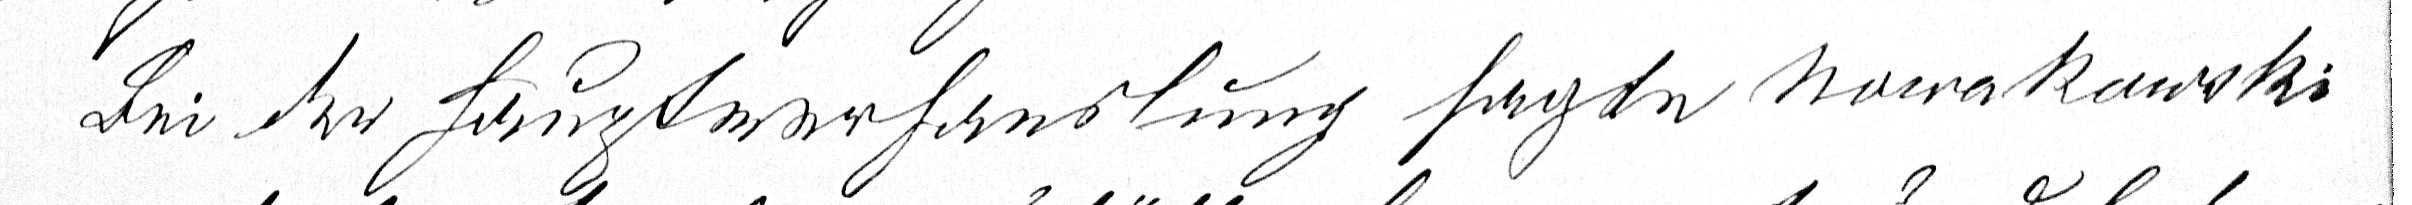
Bei der Hauptverhandlung sagte Nowakowski
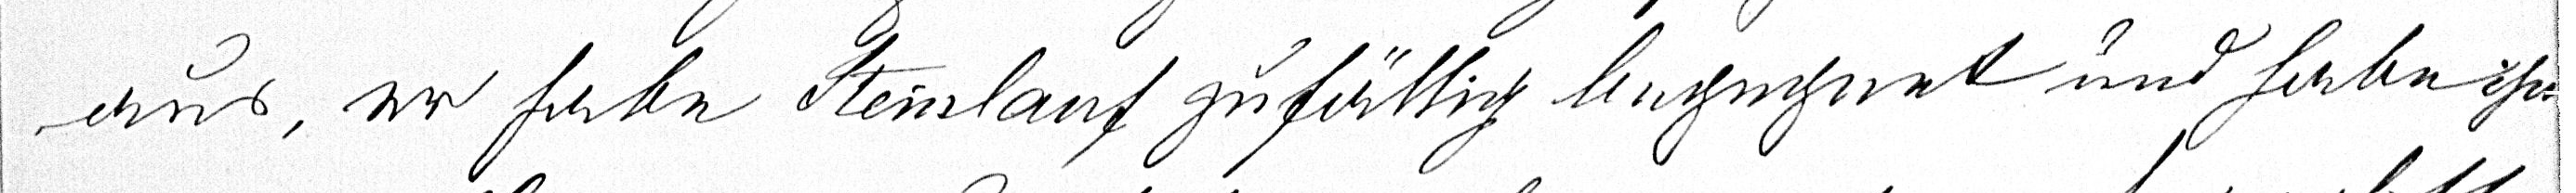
aus, er habe Steinlauf zufällig begegnet und habe xx
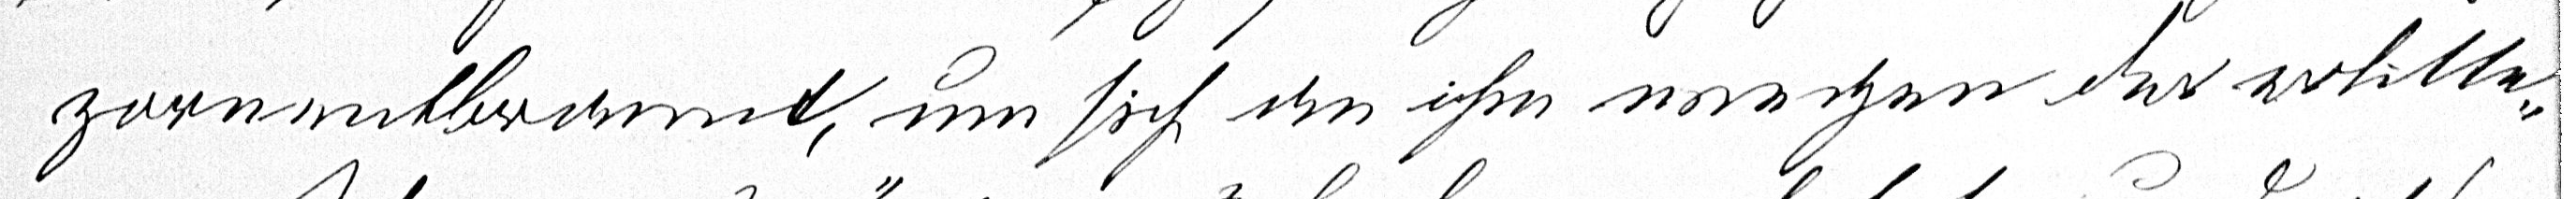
zornentbrannt, um sich an ihn wegen der erlitte¬
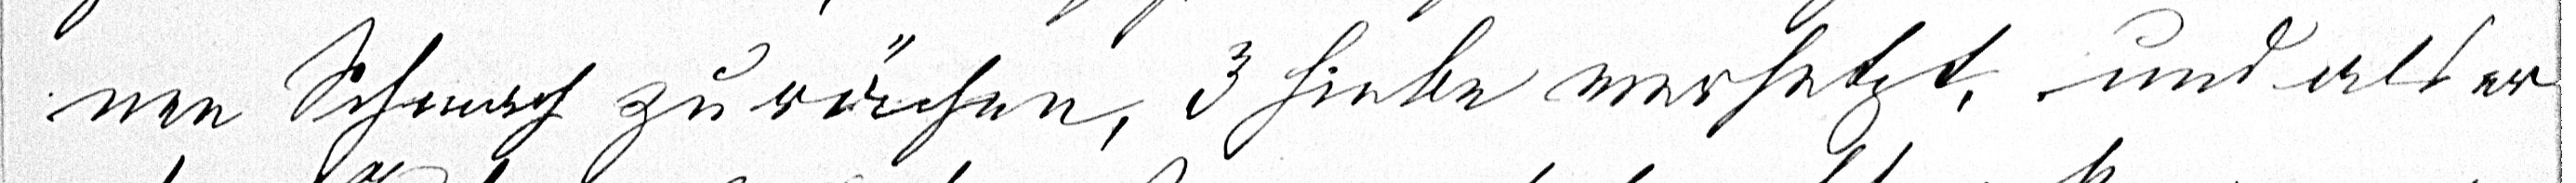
nen Schmach zu rächen, 3 Hinke versetzt, und als er
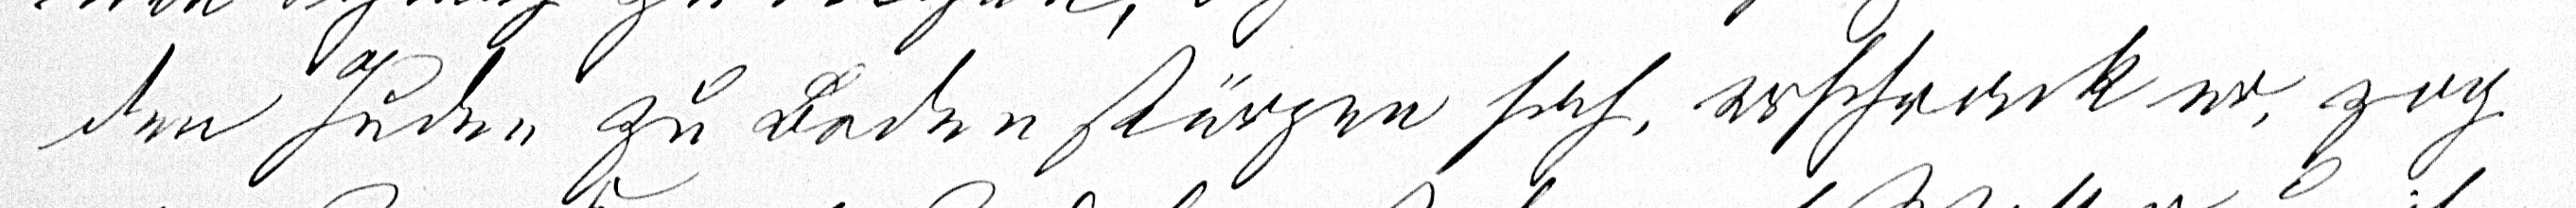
den Juden zu Bodenstürzen sah, erschrack er, zog
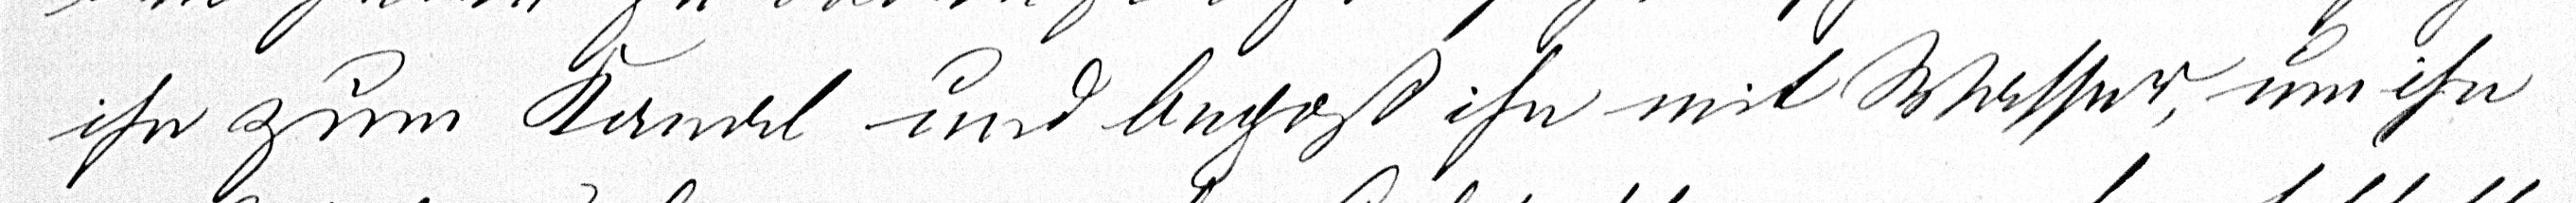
ihn zum Kanal und begoß ihn mit Wasser, um ihn
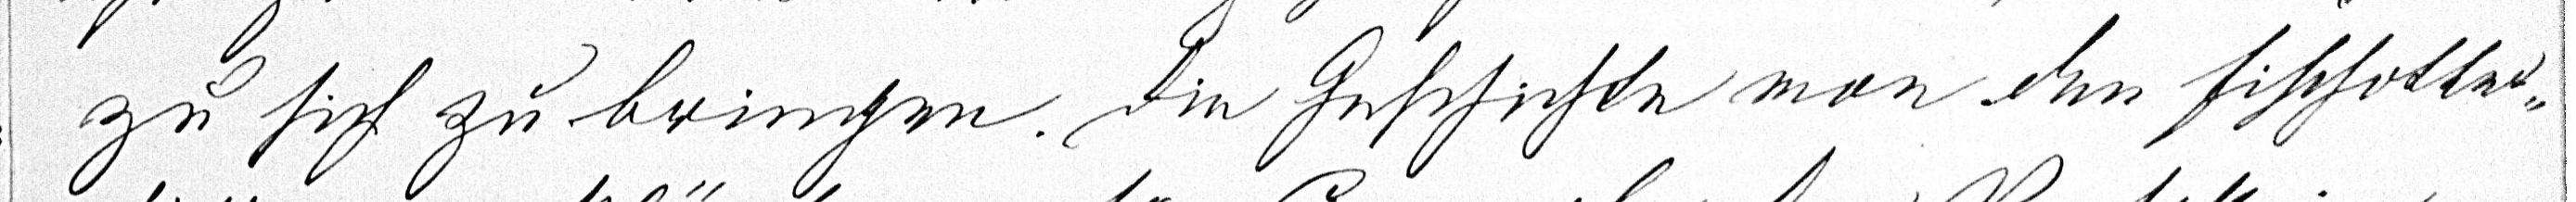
zu sich zu bringen. Die Geschichte mon den fischotter¬
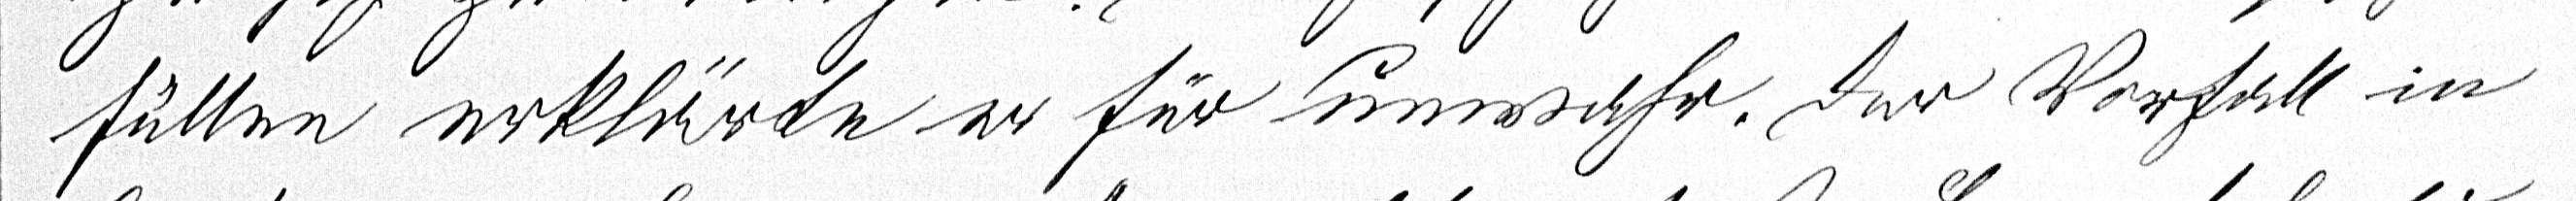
füllen erklärte er für unwahr. Der Vorfall in
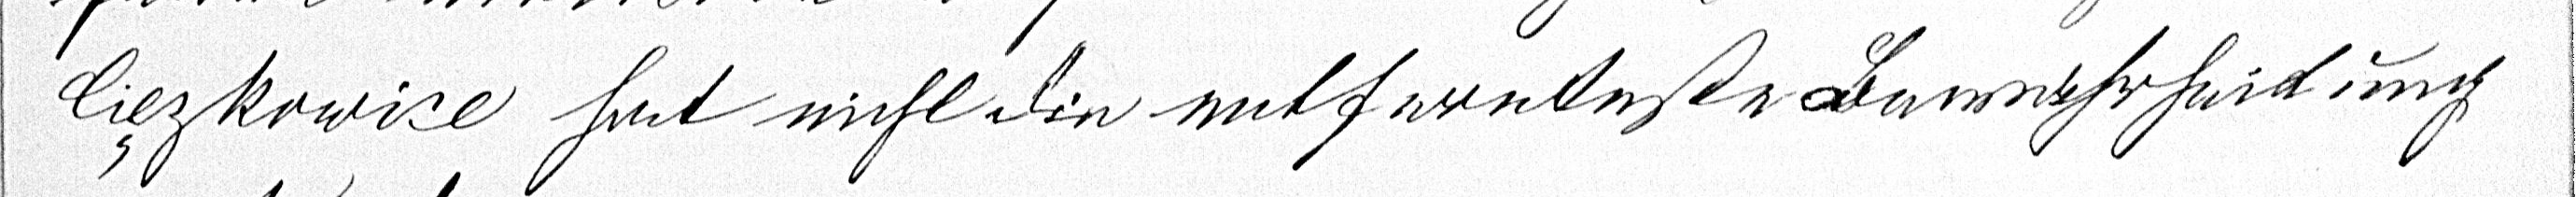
Ciękowice hat nicht die entfereteße Bewahrheitung
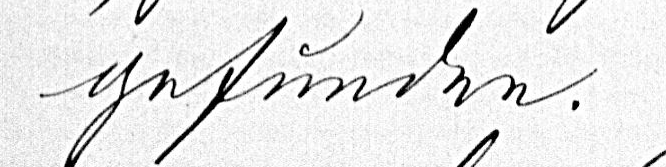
gefunden.
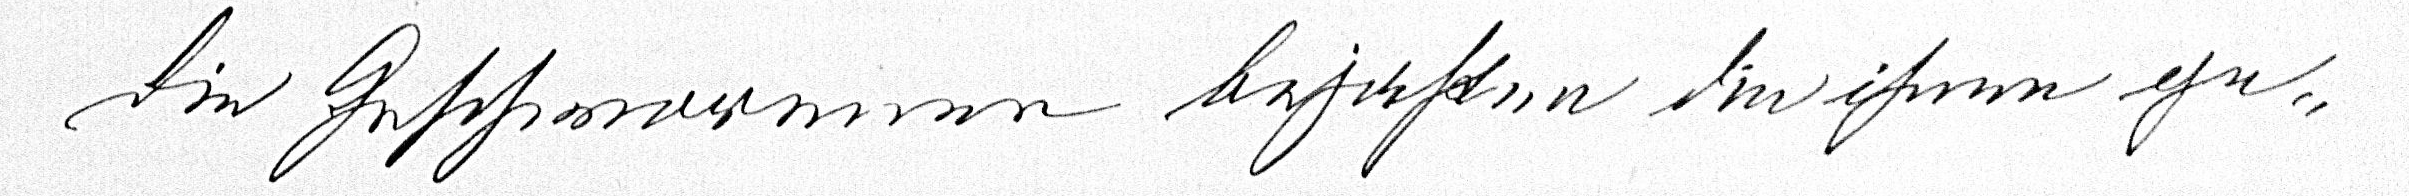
Die Geschworenen bejahten die ihnen ge¬
